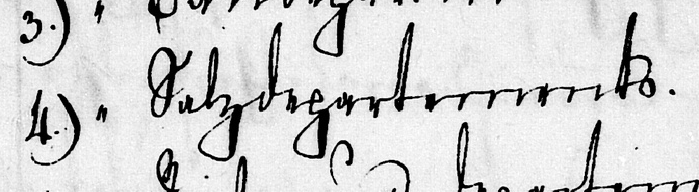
4.) " Salzdepartements.
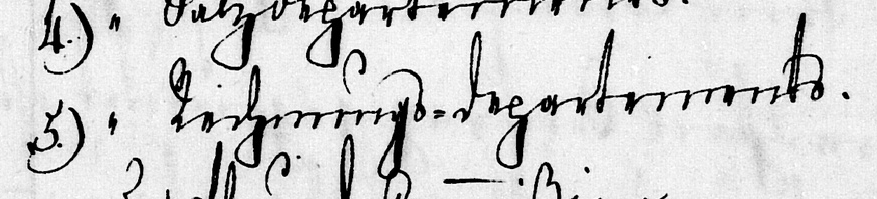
5.) " Rechnungs-Departements.
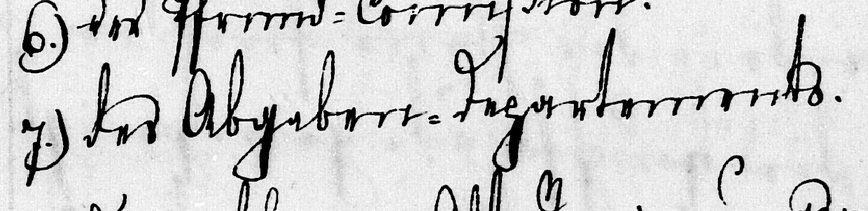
7.) des Abgaben-Departements.
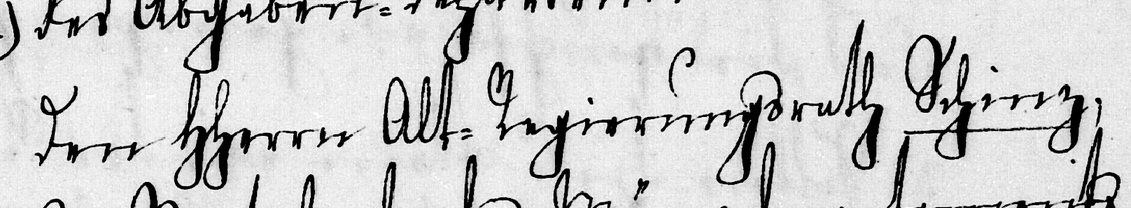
Den HHerrn Alt-Regierungsrath Schinz,
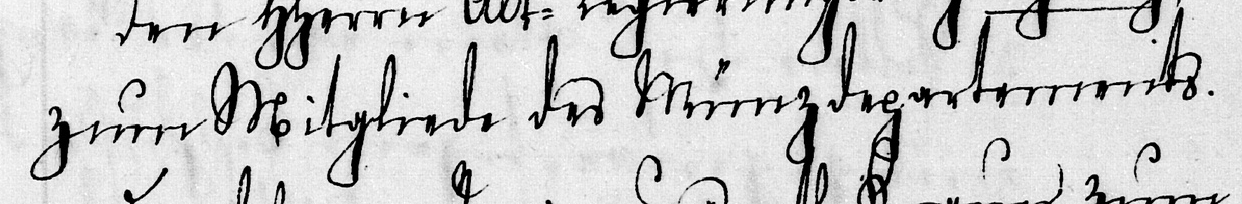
zum Mitgliede des Münzdepartements.
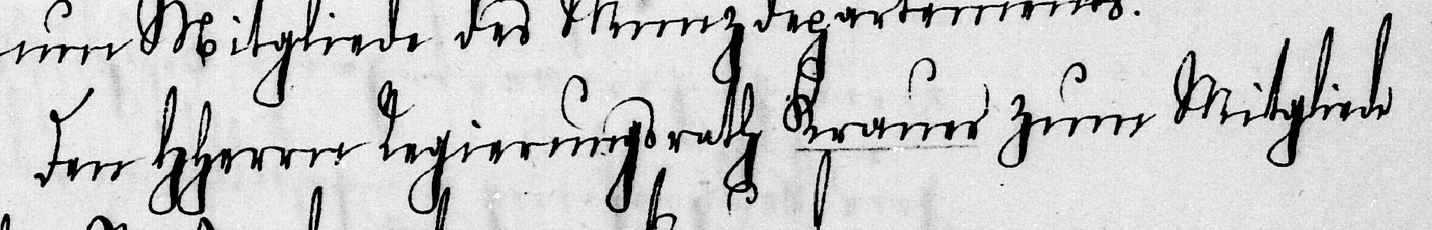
Den HHerrn Regierungsrath Krauer zum Mitgliede
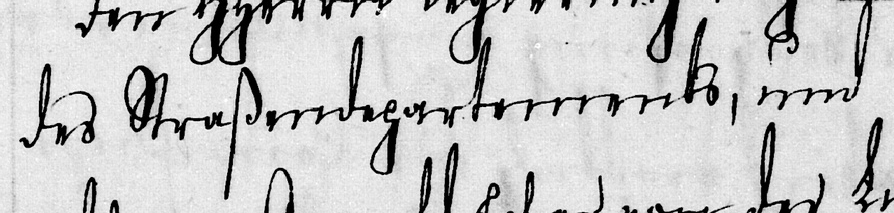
des Straßendepartements, und
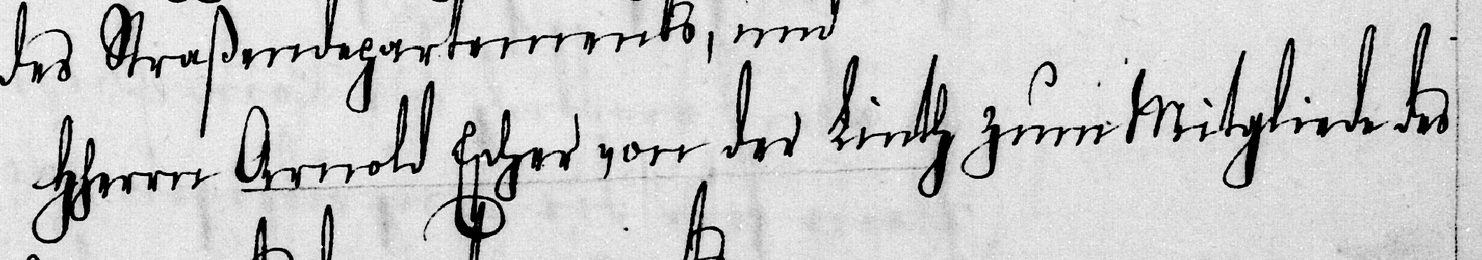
HHerrn Arnold Escher von der Linth zum Mitgliede des
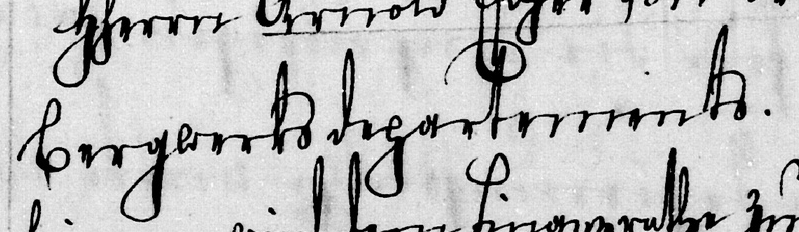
Bergwerksdepartements.
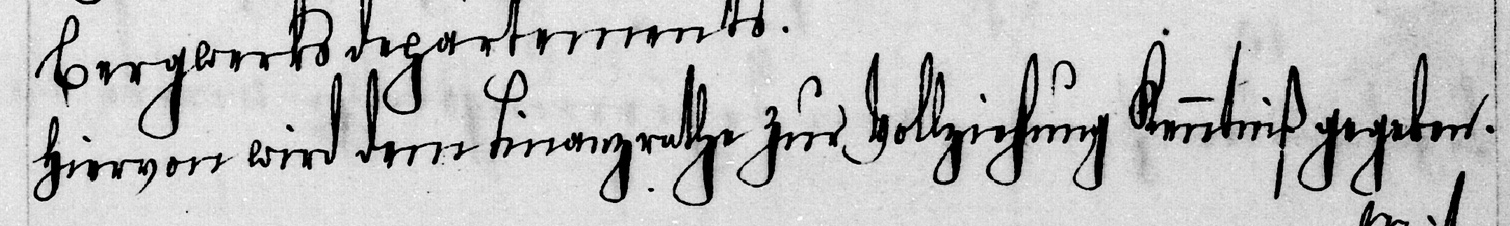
Hiervon wird dem Finanzrathe zur Vollziehung
